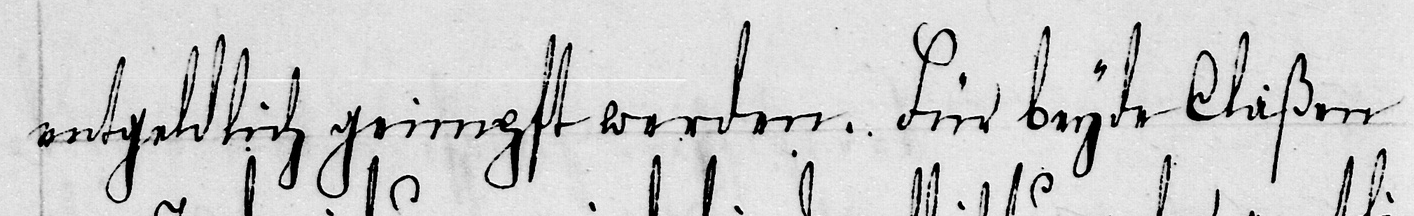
entgeldlich geimpft werden. Für beyde Claßen
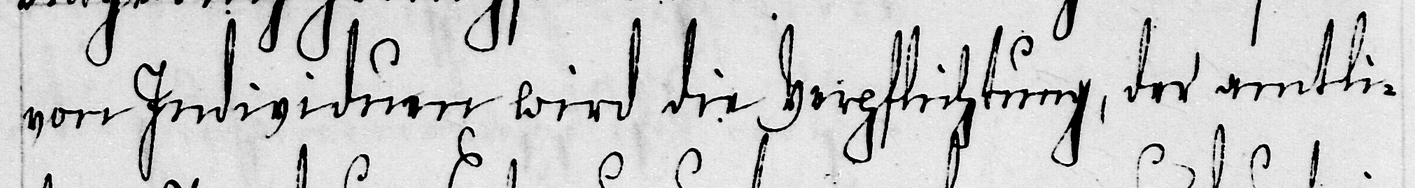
von Individuen wird die Verpflichtung, der amtli¬
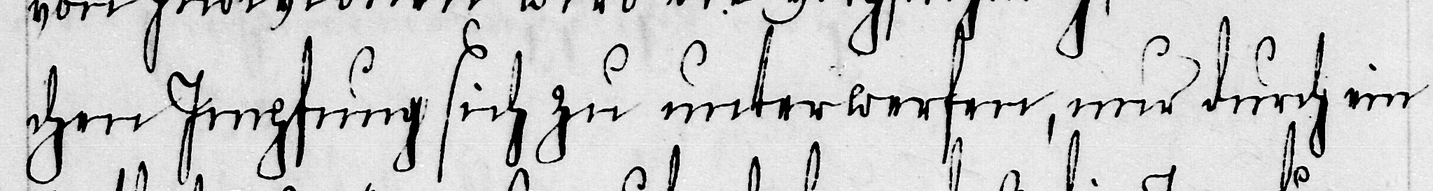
chen Impfung sich zu unterwerfen, nur durch ein
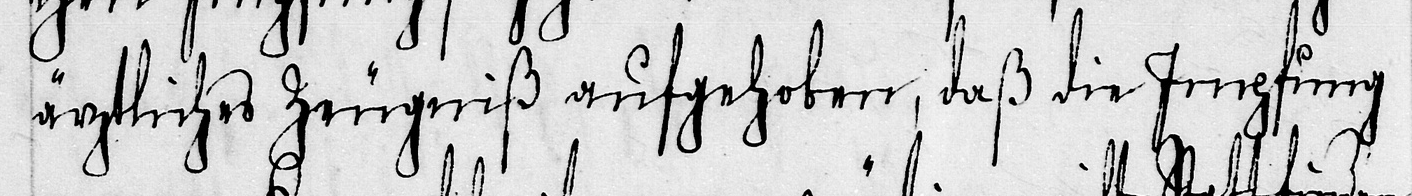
ärztliches Zeugniß aufgehoben, daß die Impfung
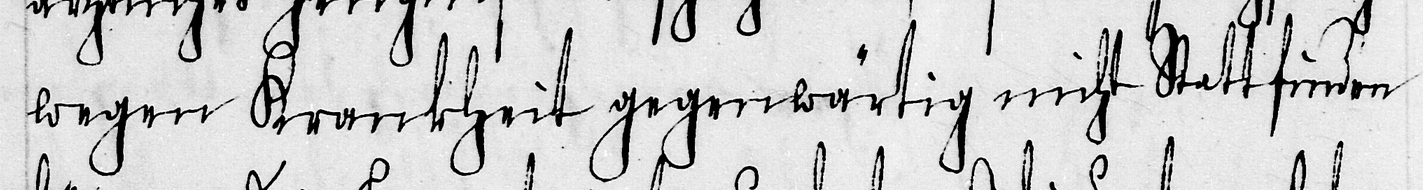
wegen Krankheit gegenwärtig nicht Statt finden
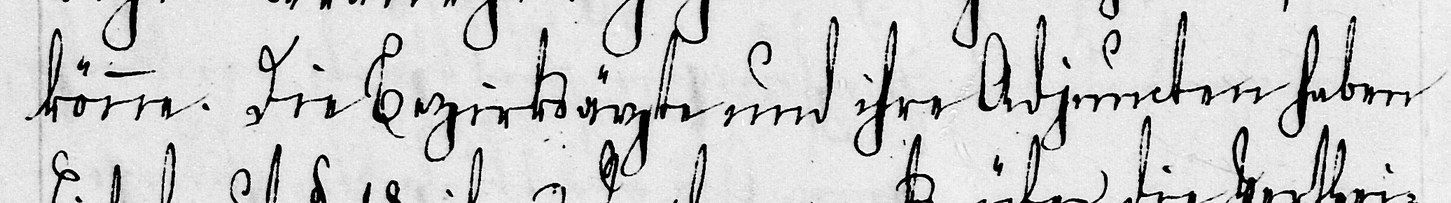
könne. Die Bezirksärzte und ihre Adjuncten haben
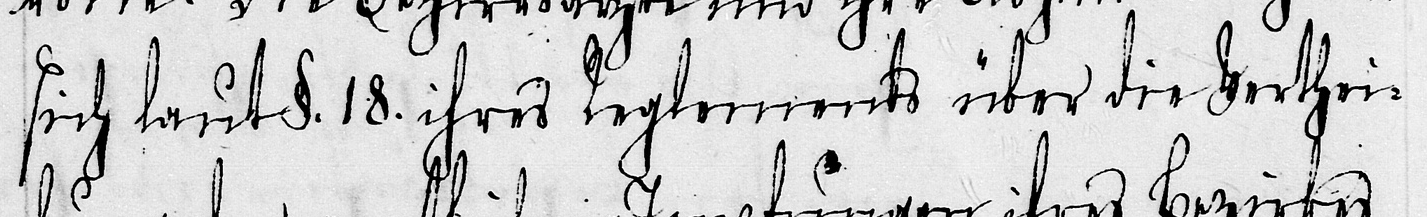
sich laut §. 18. ihres Reglements über die Verthei¬
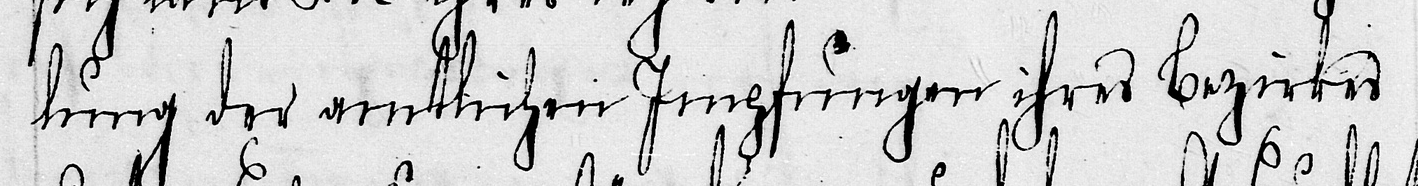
lung der amtlichen Impfungen ihres Bezirkes
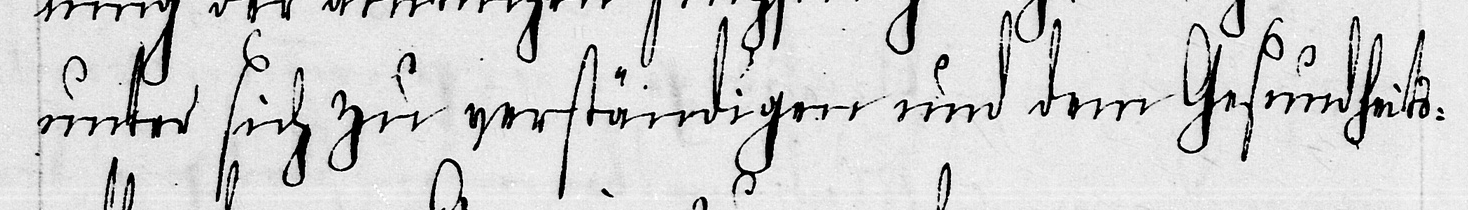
unter sich zu verständigen und dem Gesundheits¬
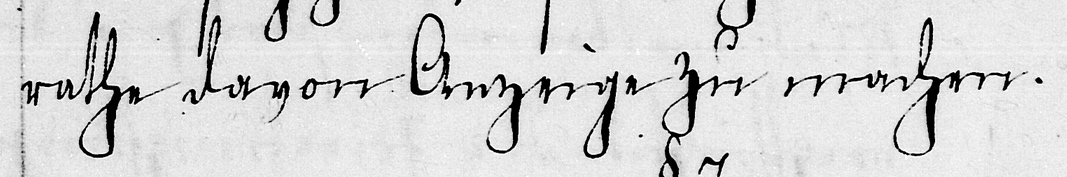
rathe davon Anzeige zu machen.
